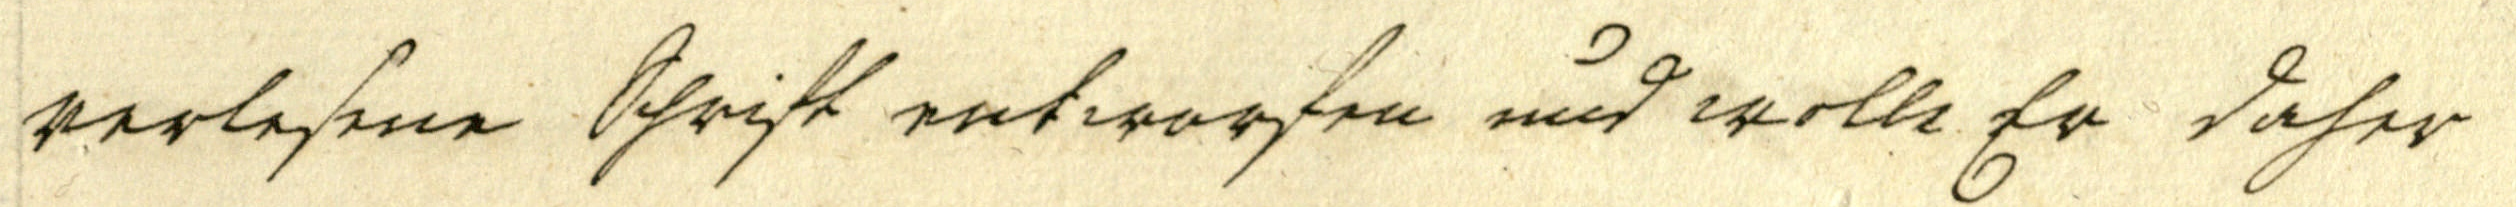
verlesene Schrift entworfen und wolle Er daher
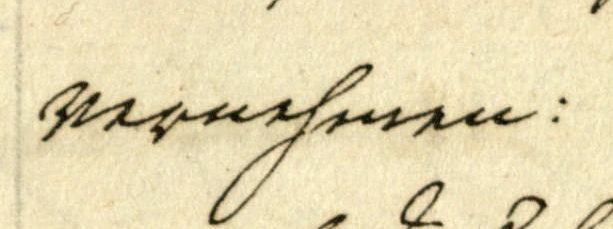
vernehmen:
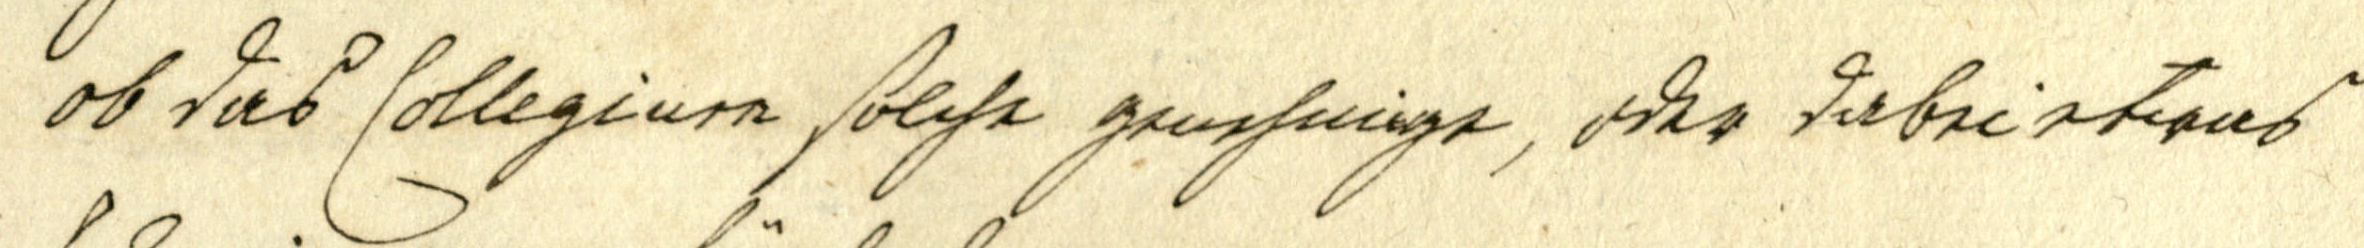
ob das Collegium solche genehmige, oder dabei etwas
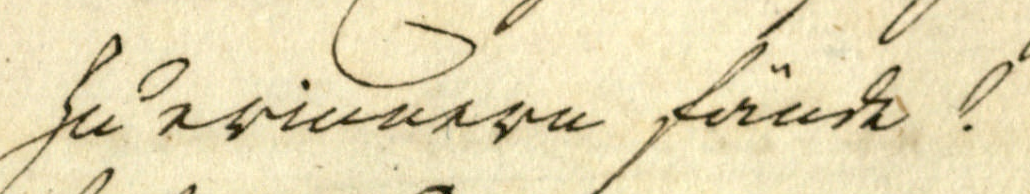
zu erinnern fände!
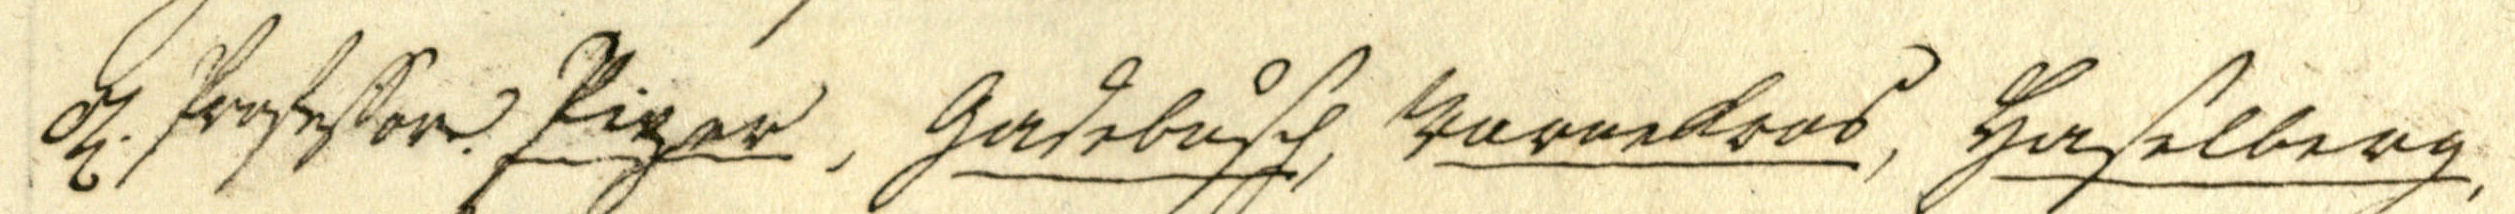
dh. Prof. Piper, Gadebusch, Warnekros, Haselberg,
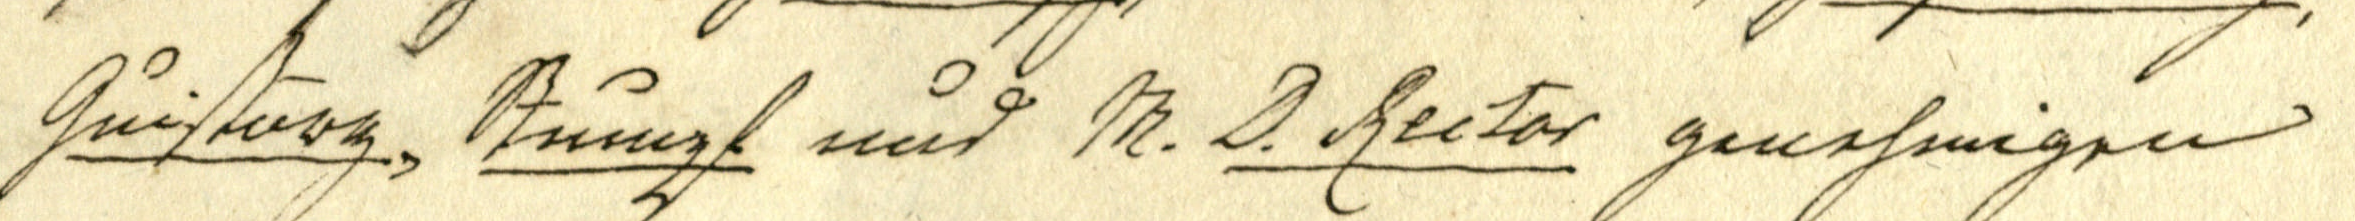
Quistorp, Stumpf und M. D. Rector genehmigen
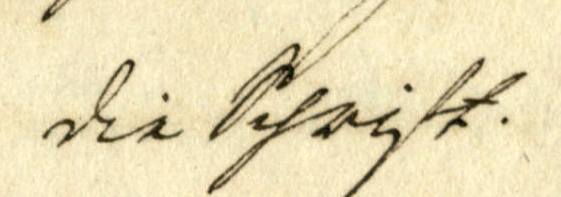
die Schrift.
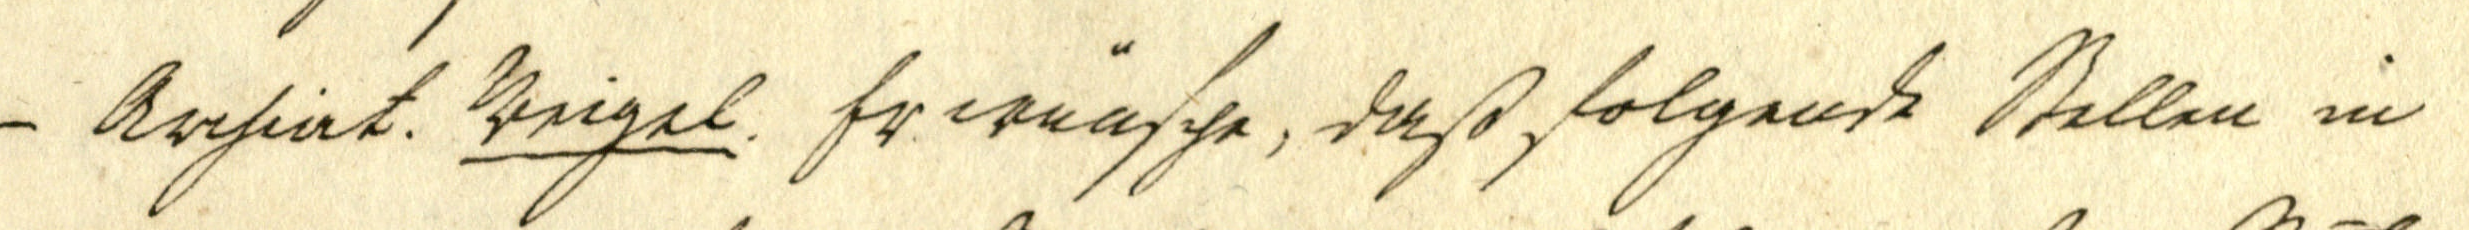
Archiat. Weigel. Er wünsche, daß folgende Stellen in
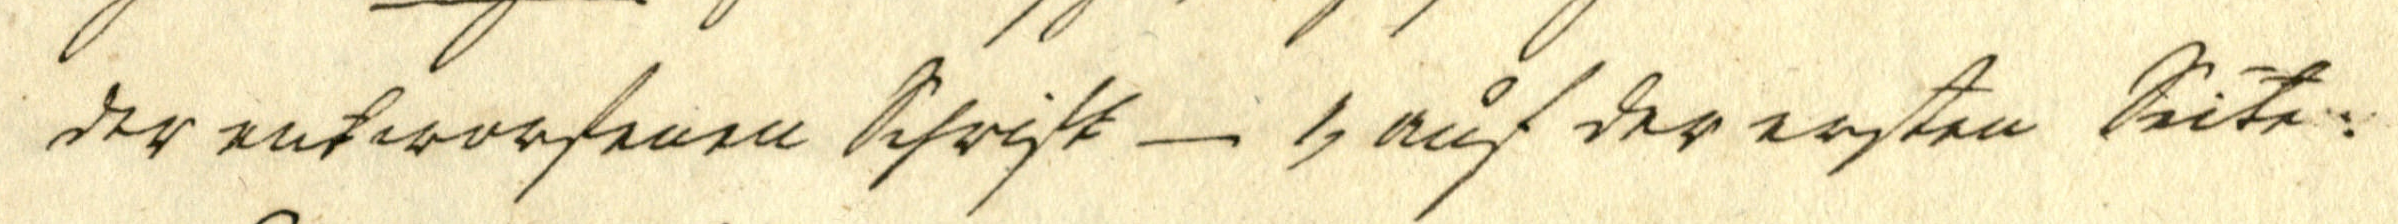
der entworfenen Schrift 1, auf der ersten Seite
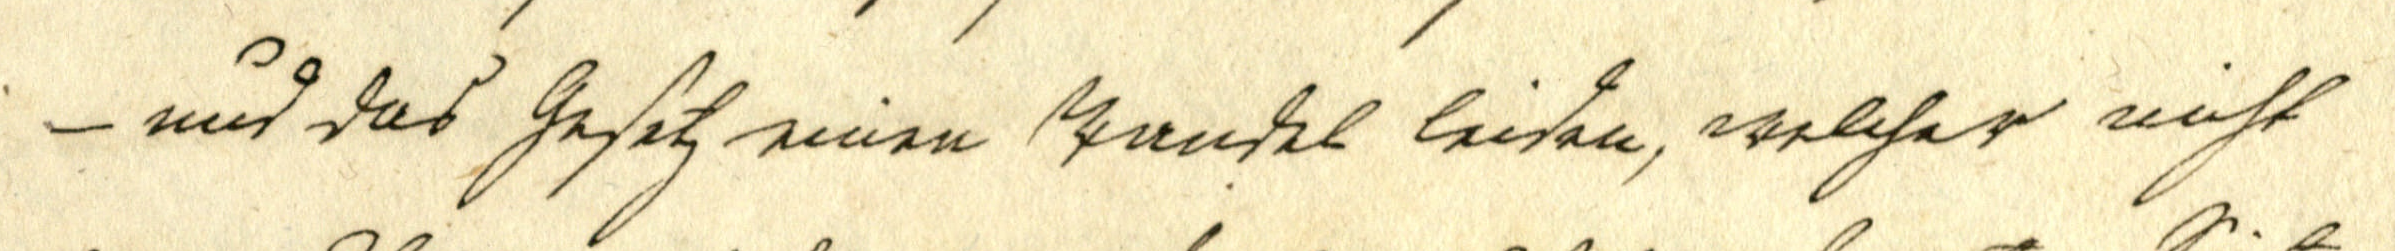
und das Gesetz einen Wandel leiden, welcher nicht
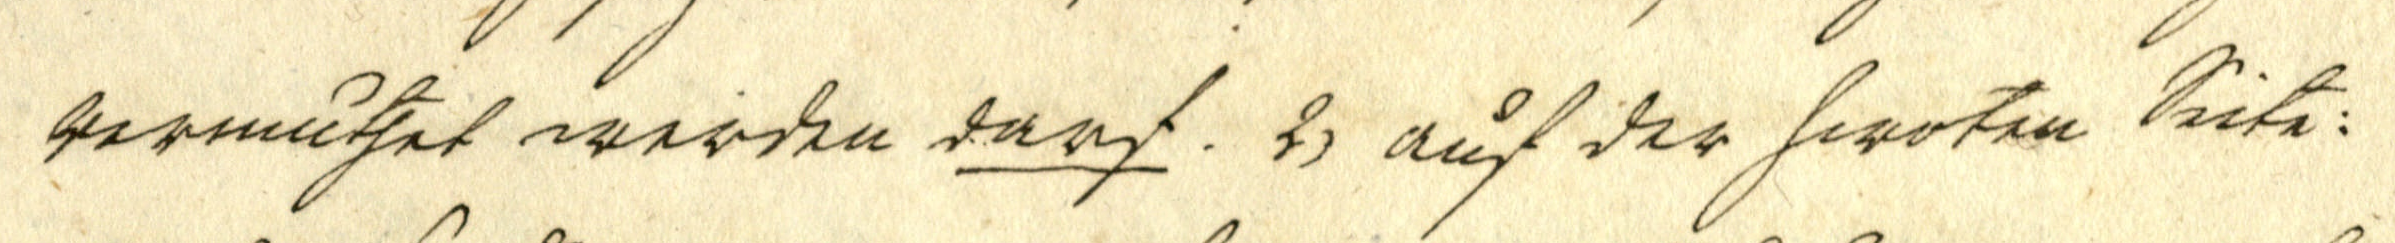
vermuthet werden darf. 2, auf der zwoten Seite:
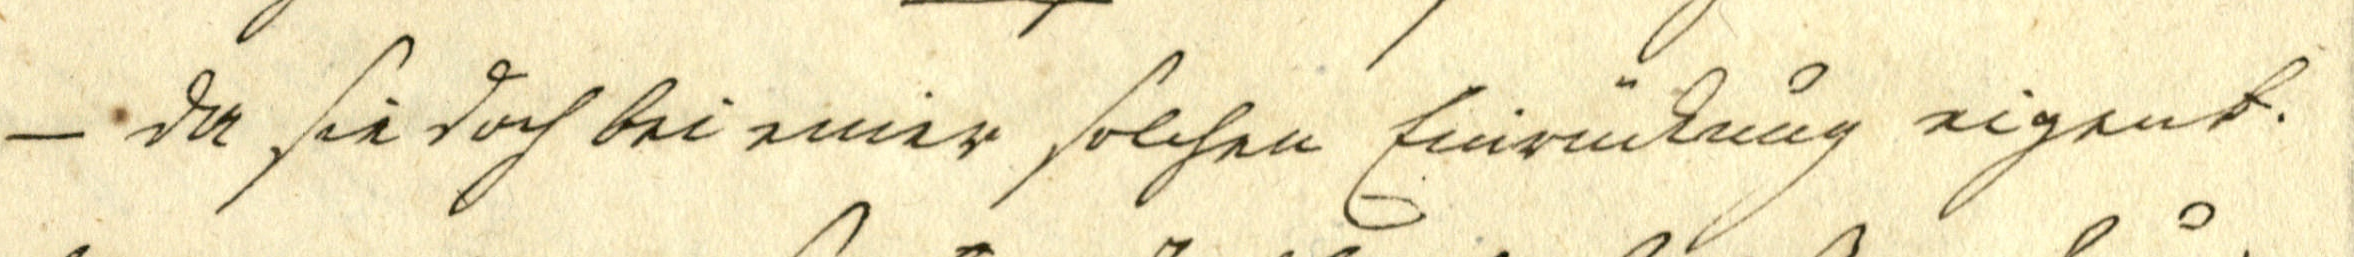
da sie doch bei einer solchen Einrückung eigent¬
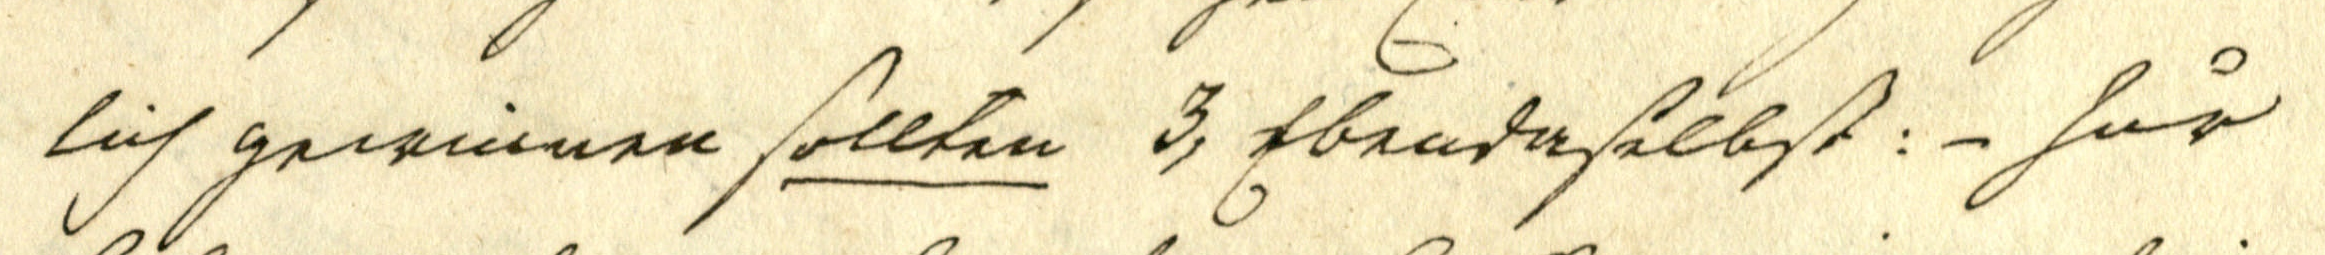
lich gewinnen sollten 3, Ebendaselbst: zur
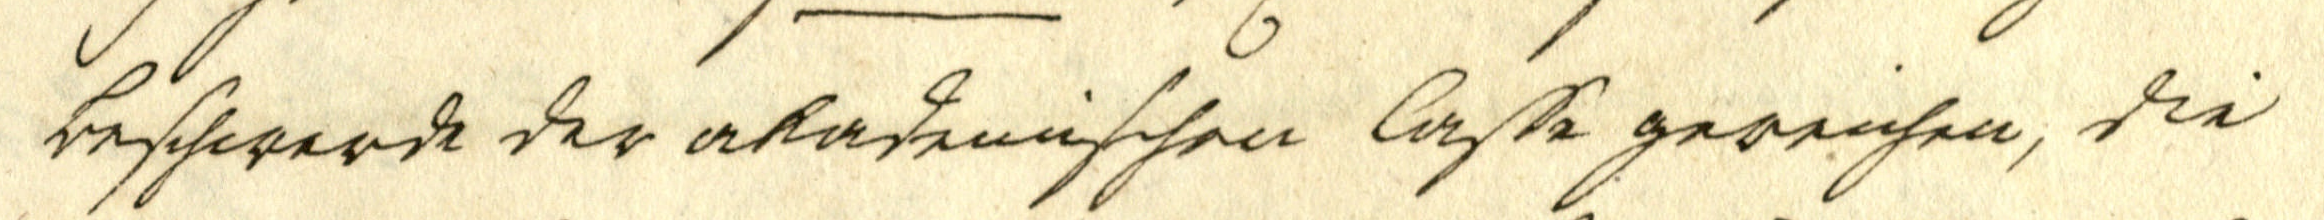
Beschwerde der akademischen Casse gereichen, die
